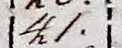41.
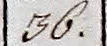36.
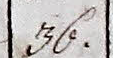36.
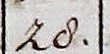28.
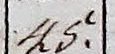45.
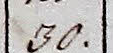30.
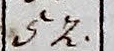52.
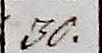30.
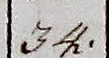34.
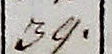39.
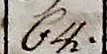64.
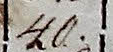40.
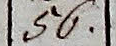56.
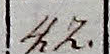42.
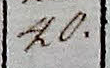40.
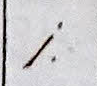1.
